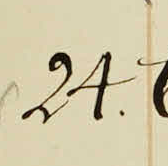24.
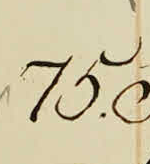75.
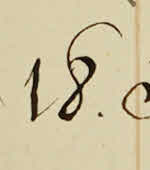18.
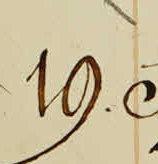19.
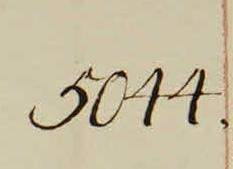5044
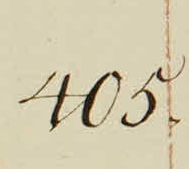405
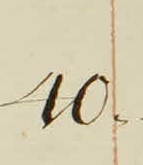40
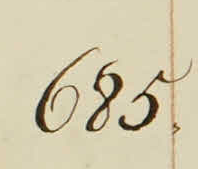685
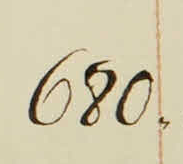680
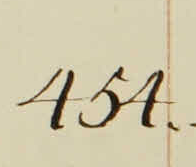454
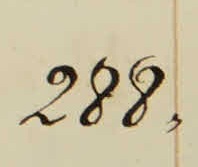288
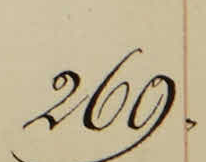269
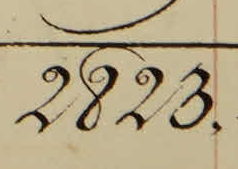2823
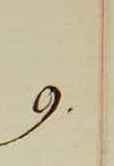9.
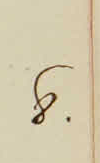8.
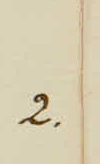2.
